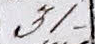31
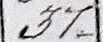37
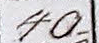40
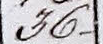36
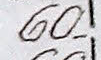60
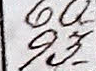93
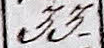33
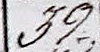39
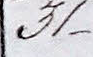31
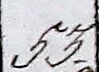53
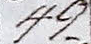49
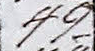49
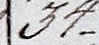34
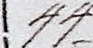44
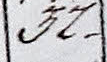32
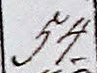54
